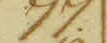77.
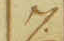7.
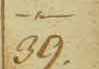39.
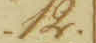12.
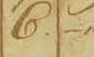6.
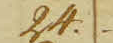24.
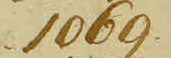1069.
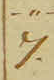7.
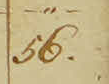56.
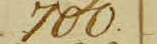700.
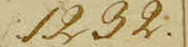1232.
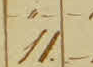11.
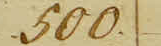500.
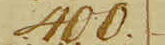400.
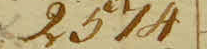2574
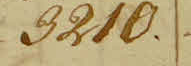3210.
